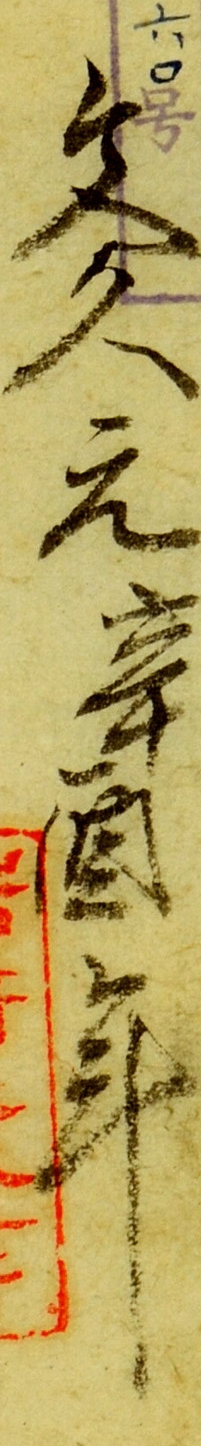文久元辛酉年
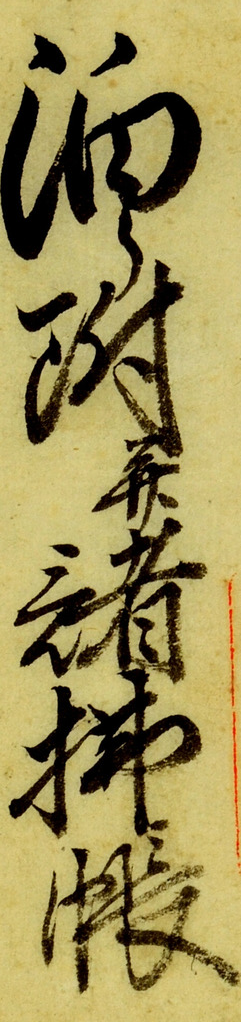泊り附并諸払帳
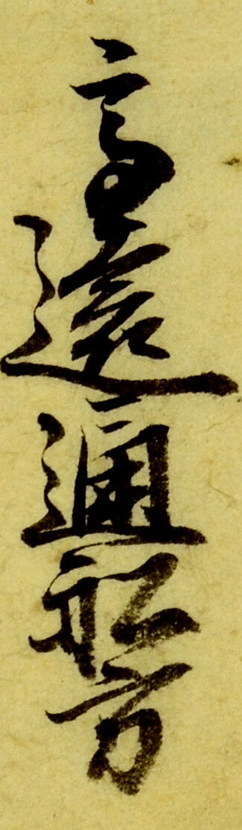高遠通船方
